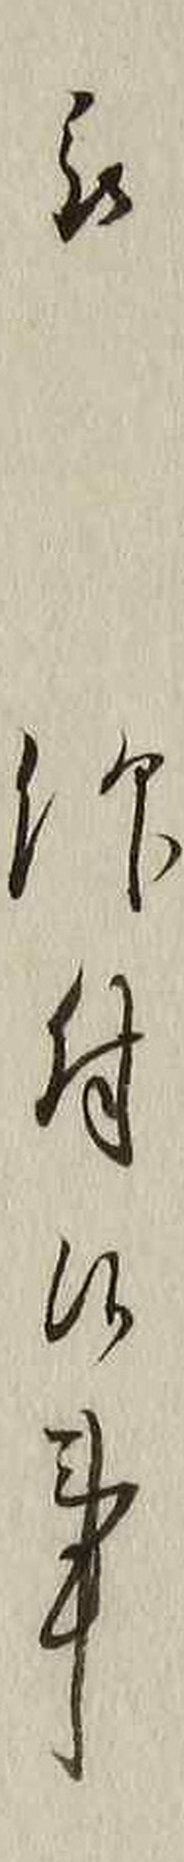被仰付候事
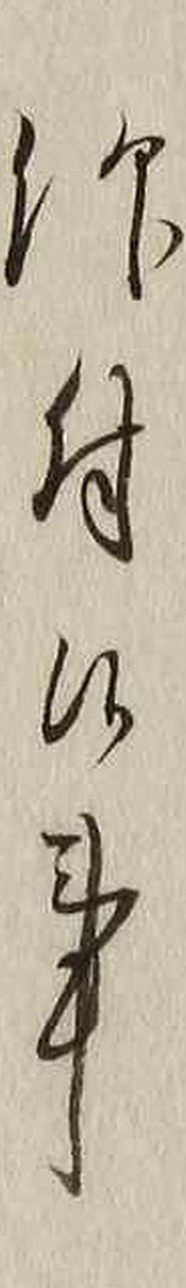仰付候事
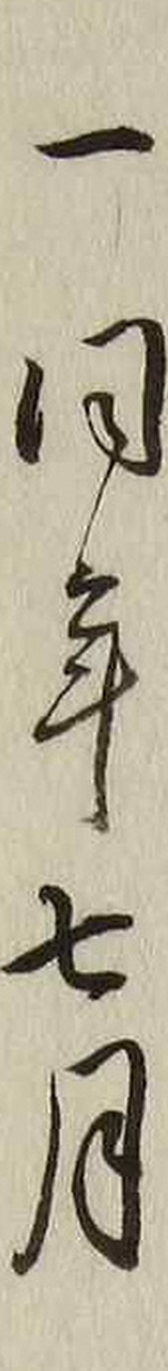一同年七月
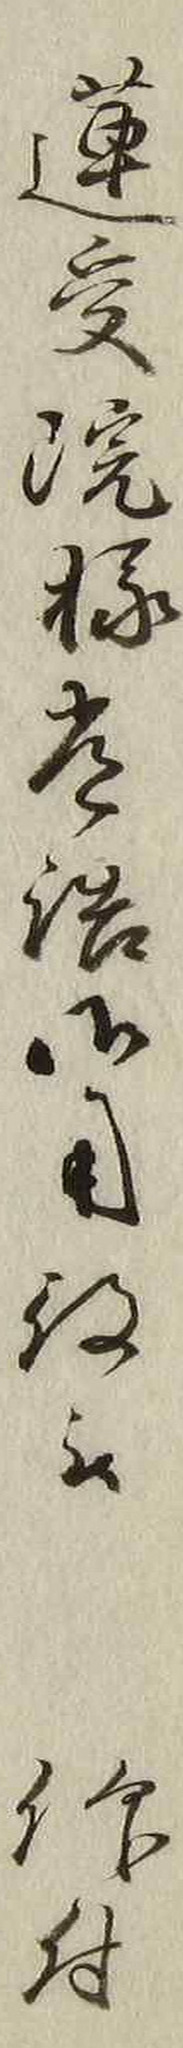蓮受院様常詰御用役被仰付
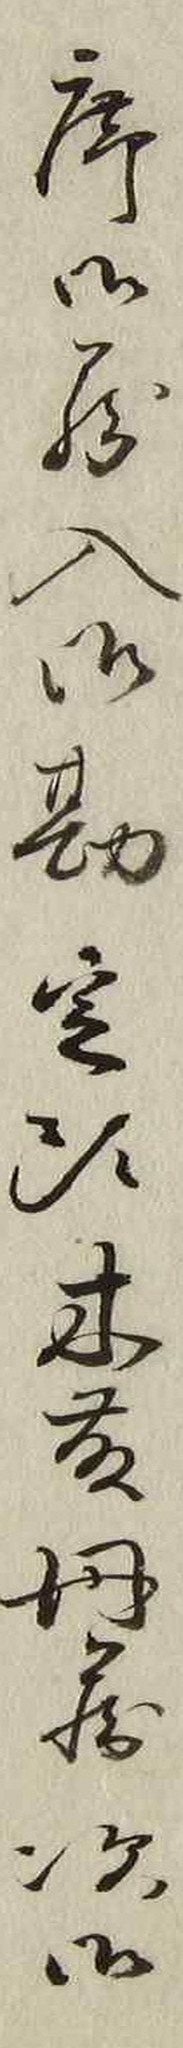席御蔵入御勘定頭木藤丹蔵次御
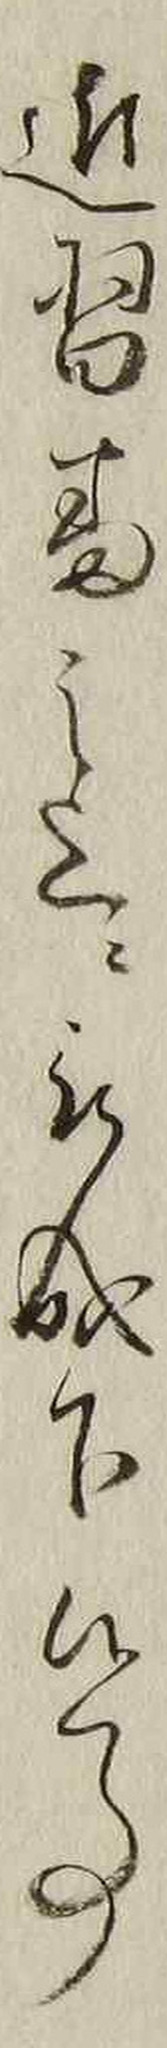近習番之上ニ被成下候事
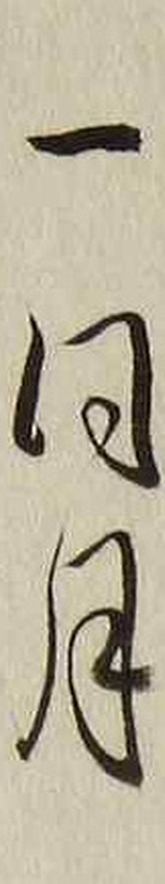一同月
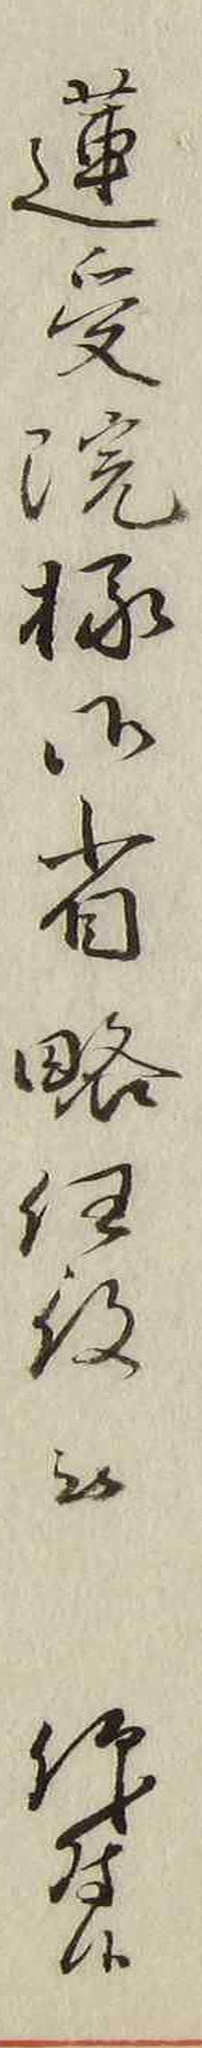蓮受院様御省略任役被仰付候

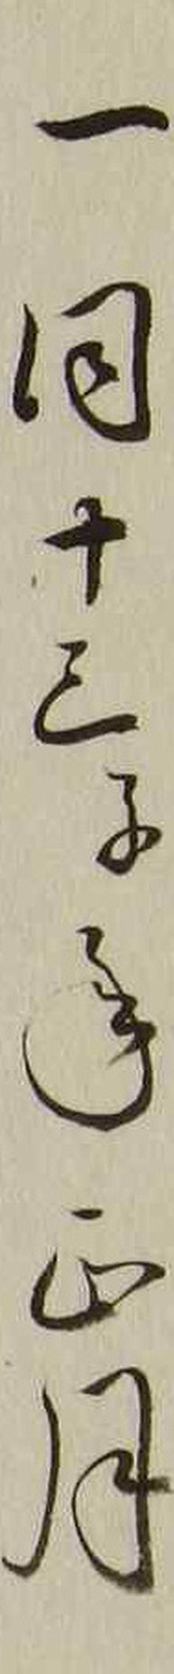一同十三子年正月
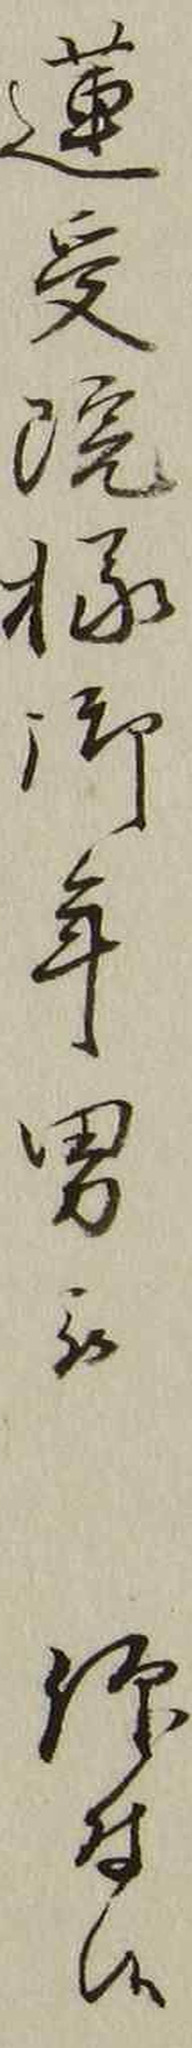蓮受院様御年男被仰付候
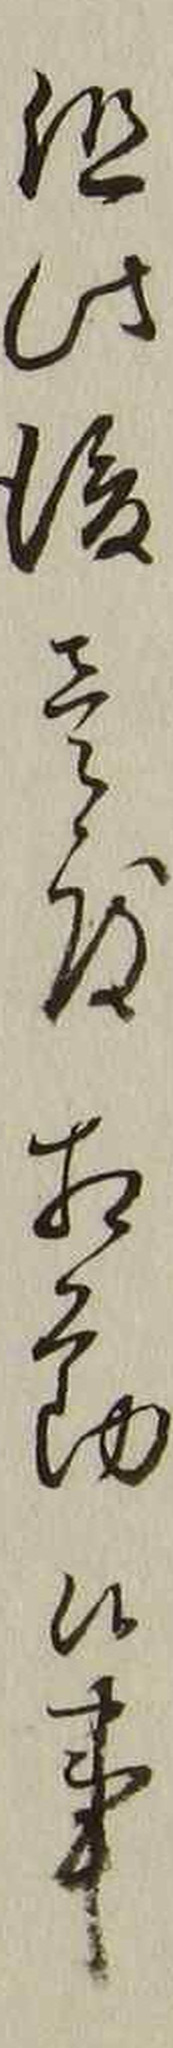但此後壱度相勤候事
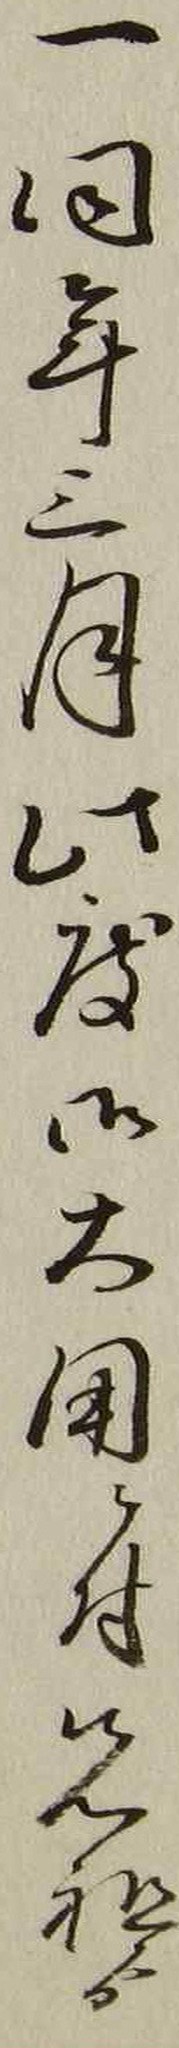一同年三月此度御大用ニ付先祖ゟ
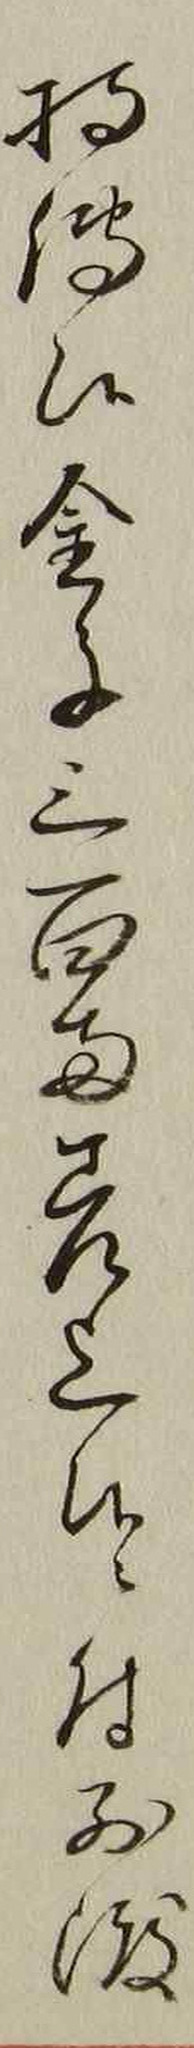持伝候金子三百両差上候ニ付別渡
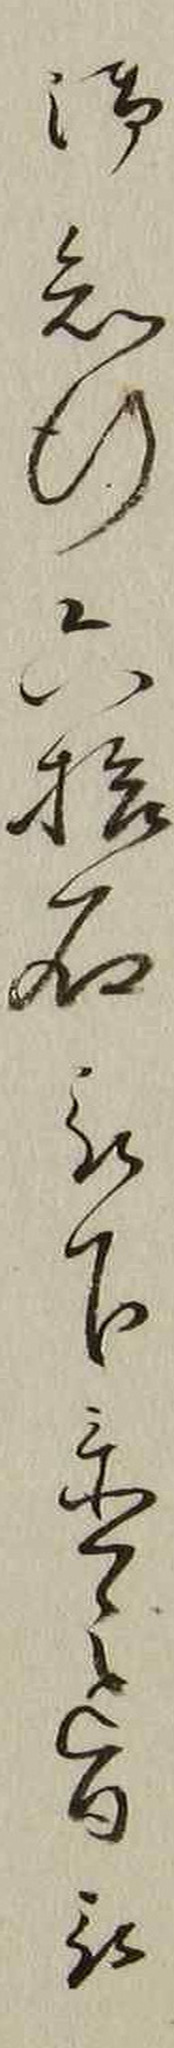御知行六拾石被下置候旨被
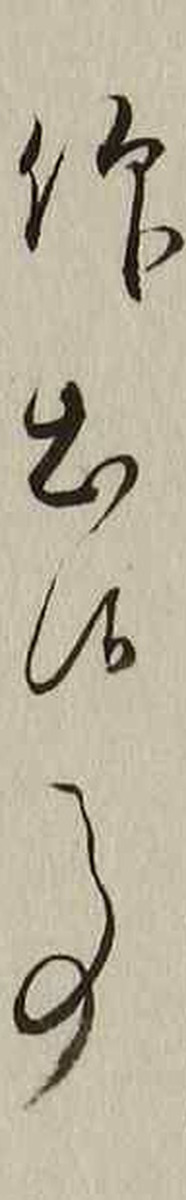仰出候事
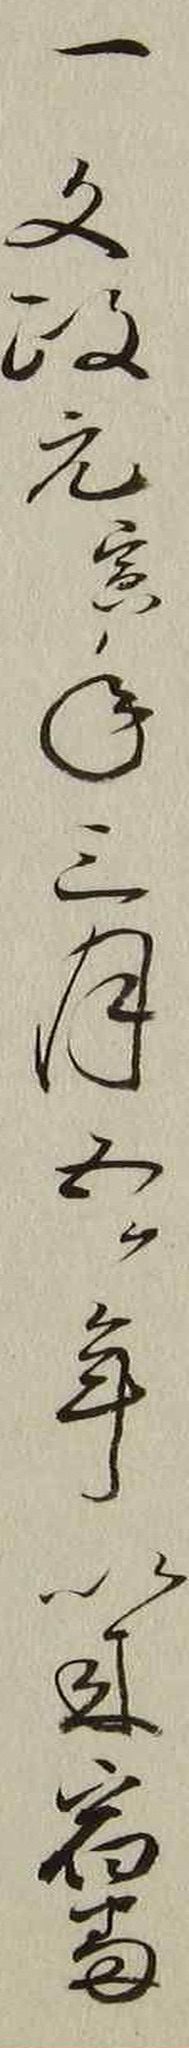一文政元寅年三月五ケ年以来宿番
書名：諸士系譜　巻之4　い之部4
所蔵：会津若松市立会津図書館
